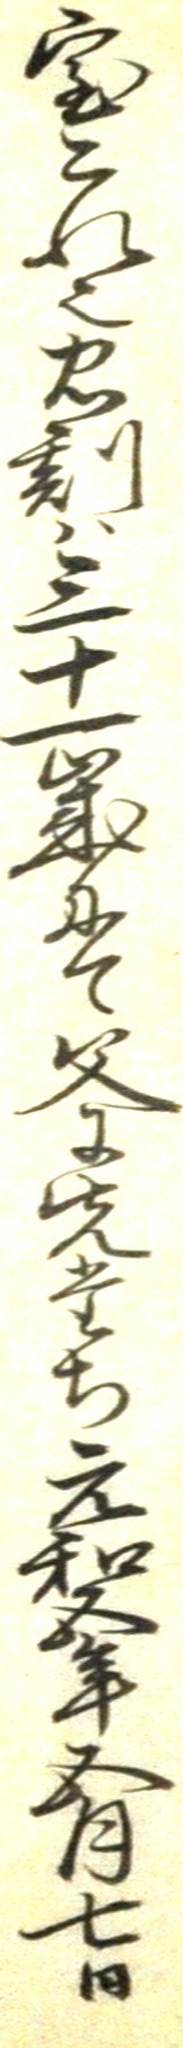室これ也忠刻は三十一歳にて父に先たち元和五年五月七日
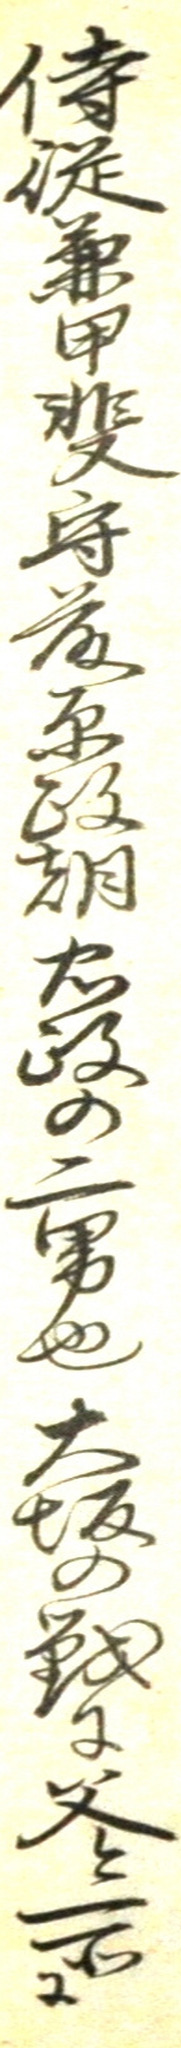侍従兼甲斐守藤原政朝忠政の二男也大坂の戦に父と一所に
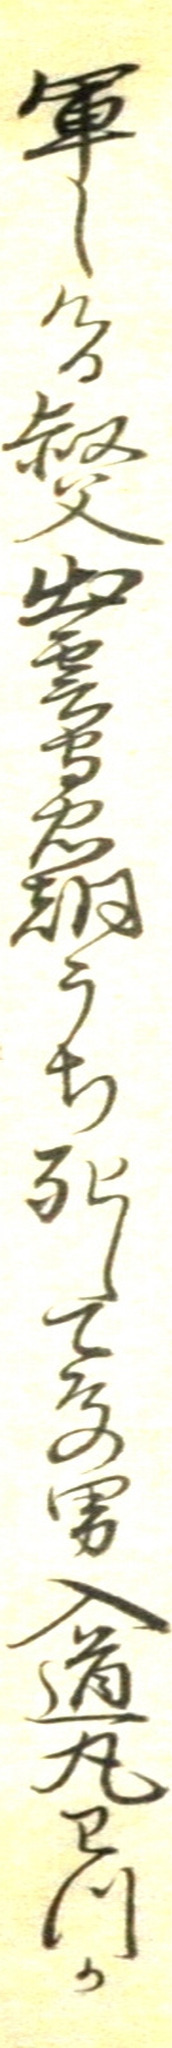軍しける叔父出雲守忠朝うち死してその男入道丸わつか
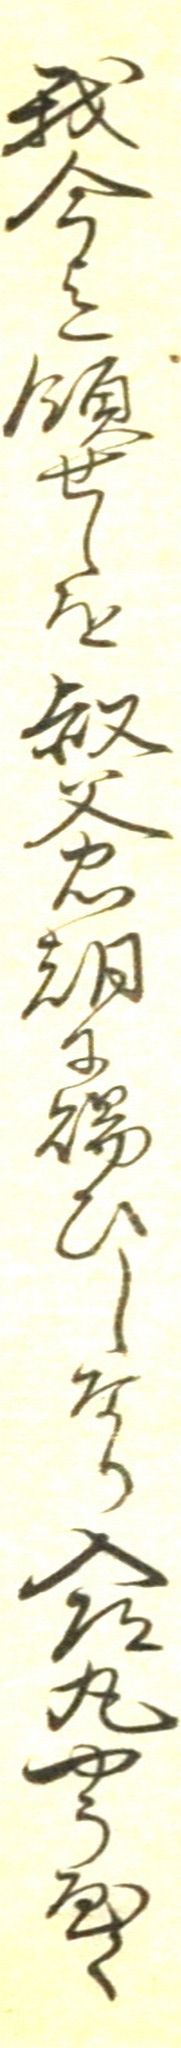我今迄領せしを叔父忠朝に賜ひしなり入道丸やうやく
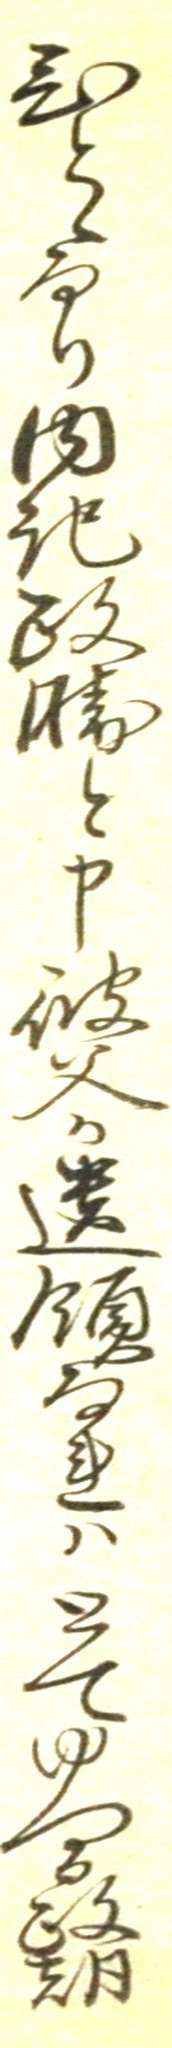ひとゝなり内記政勝と申彼父か遺領なれはとてゆつる政朝
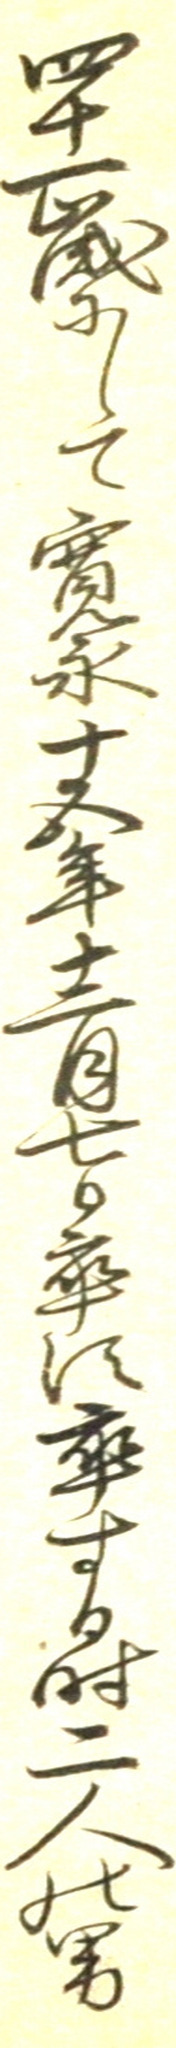四十一歳にして寛永十五年十二月七日卒する時二人の男
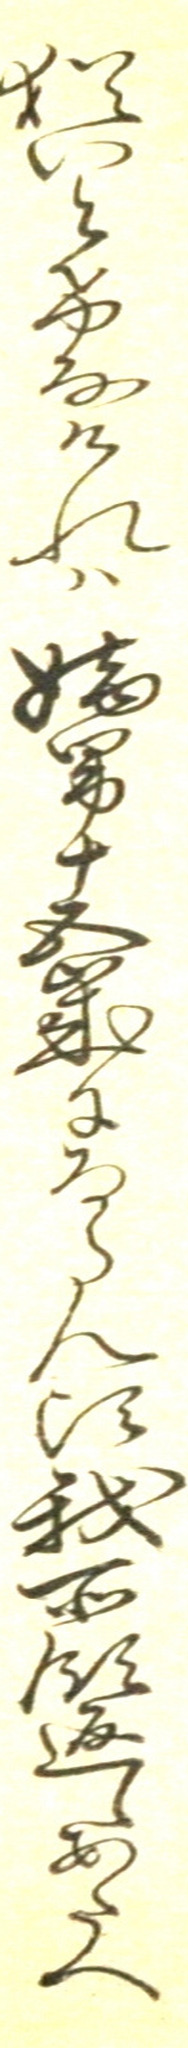猶いとけなけれは嫡男十五歳にならん頃我所領返しあたへ
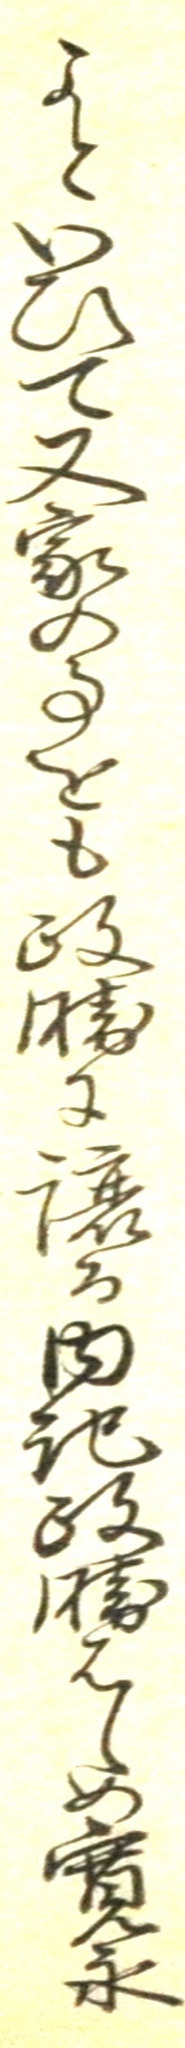よといひて又家の事をも政勝に譲る内記政勝はしめ寛永
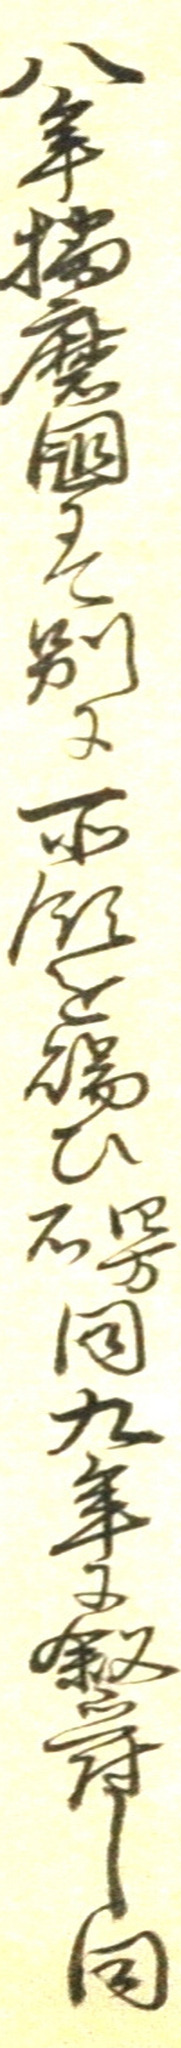八年播磨国にて別に所領を賜ひ四万石同九年に叙爵し同
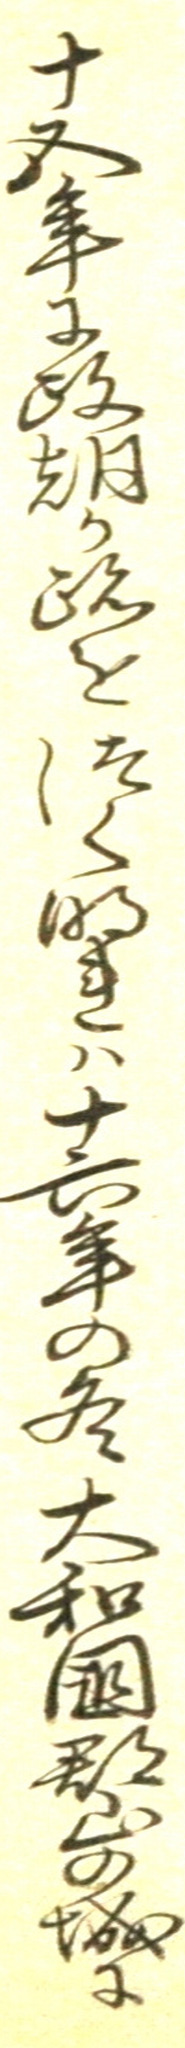十五年に政朝か跡をつく明れは十六年の冬大和国郡山の城に
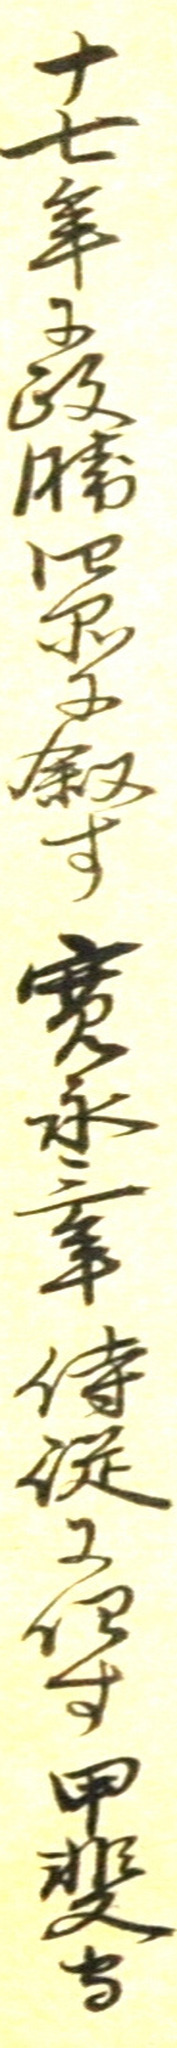十七年に政勝四品に叙す寛永三年侍従に任す甲斐守

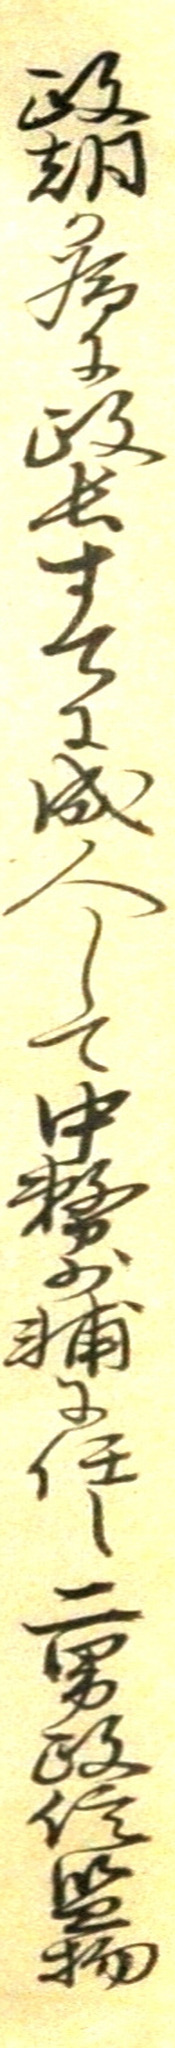政朝の為に政長すてに成人して中務少輔に任し二男政信監物
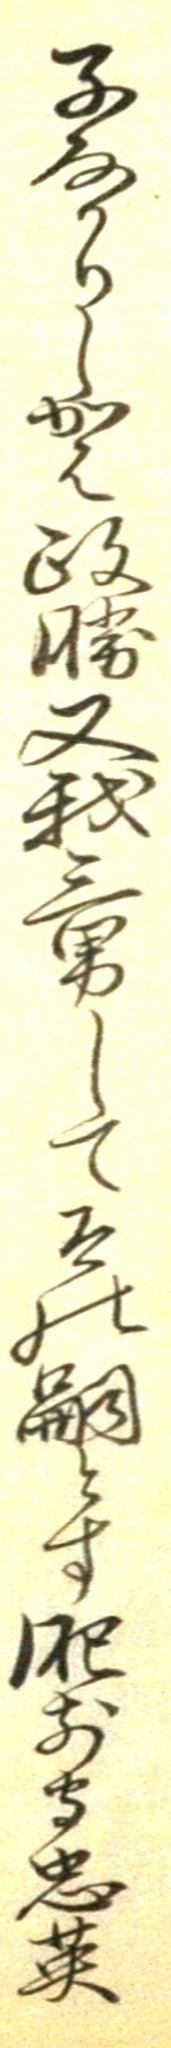子なかりしかは政勝又我三男してその嗣とす肥前守忠英
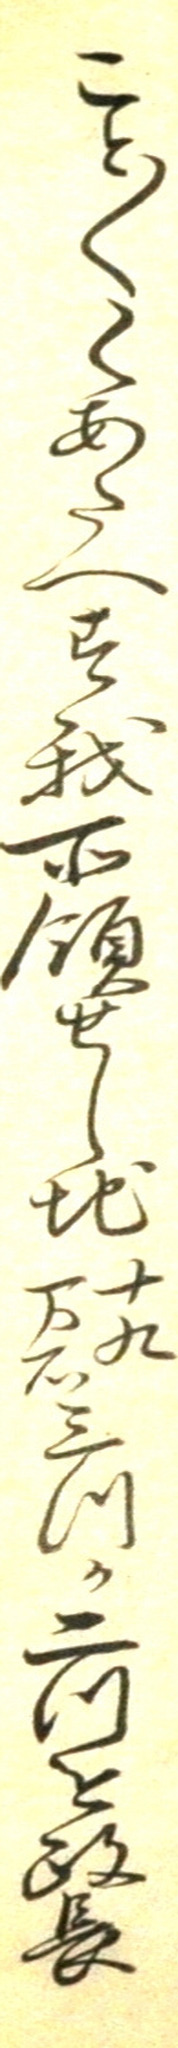こと〳〵くあたへす我所領せし地十九万石三つか二つを政長
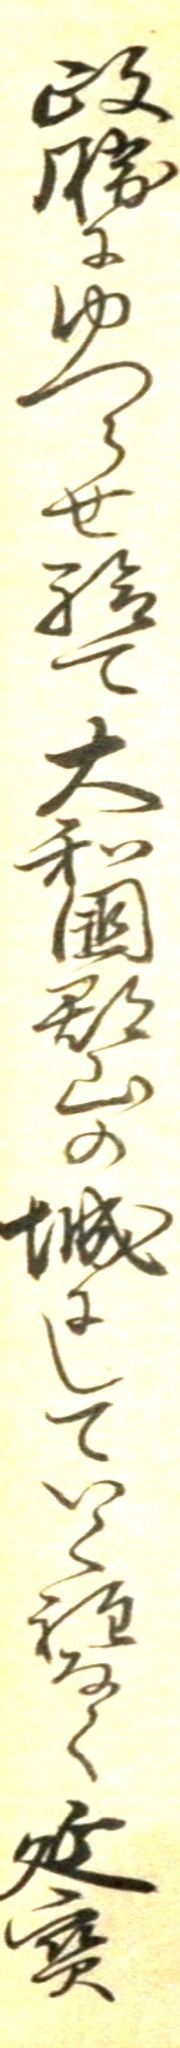政勝にゆつらせ給て大和国郡山の城にしていく程なく延宝
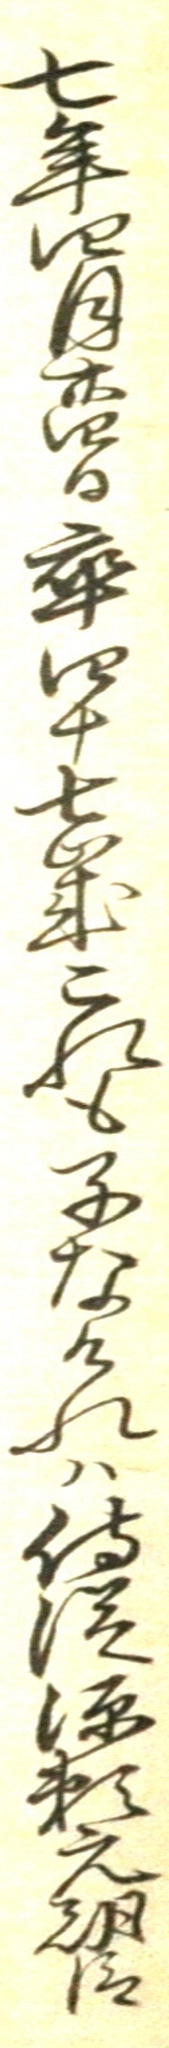七年四月廿四日卒四十七歳これも子なけれは侍従源頼元朝臣
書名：藩翰譜（四・上）
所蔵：伊那市立高遠町図書館・合同会社AMANE
